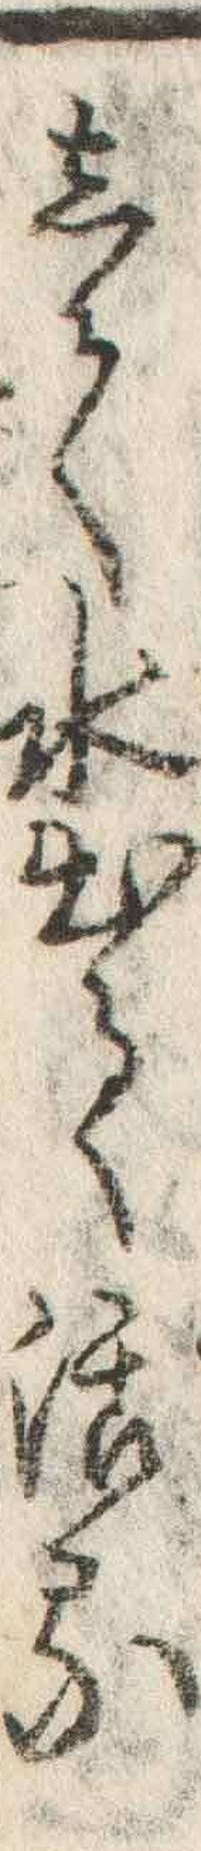して水出て活る
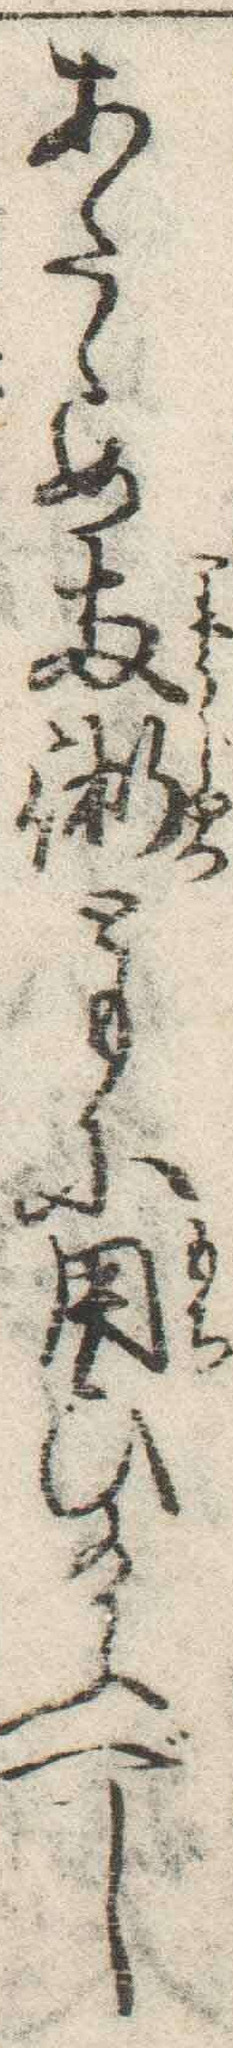あたゝめ両術ともに用ひ給ふべし
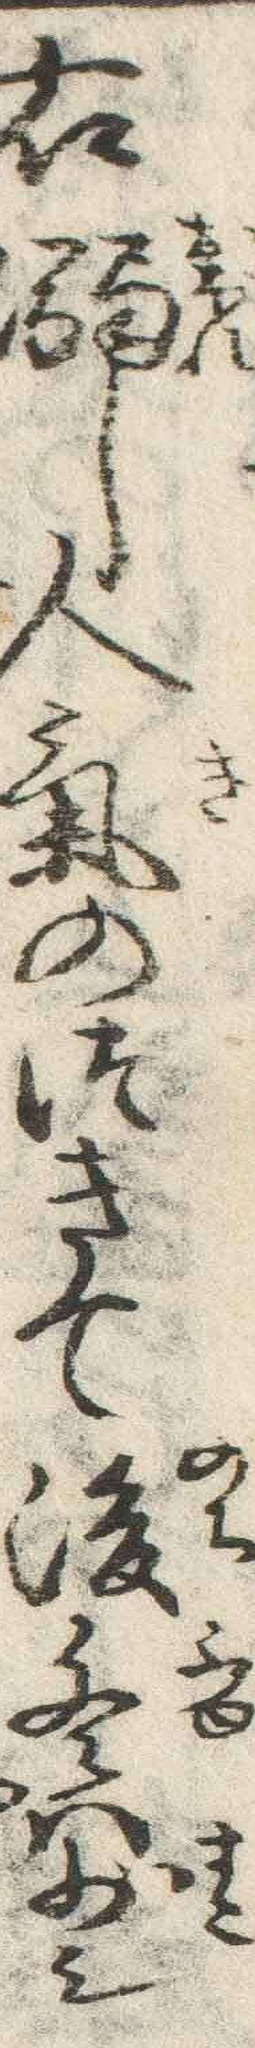右溺し人気のつきて後冬は少し
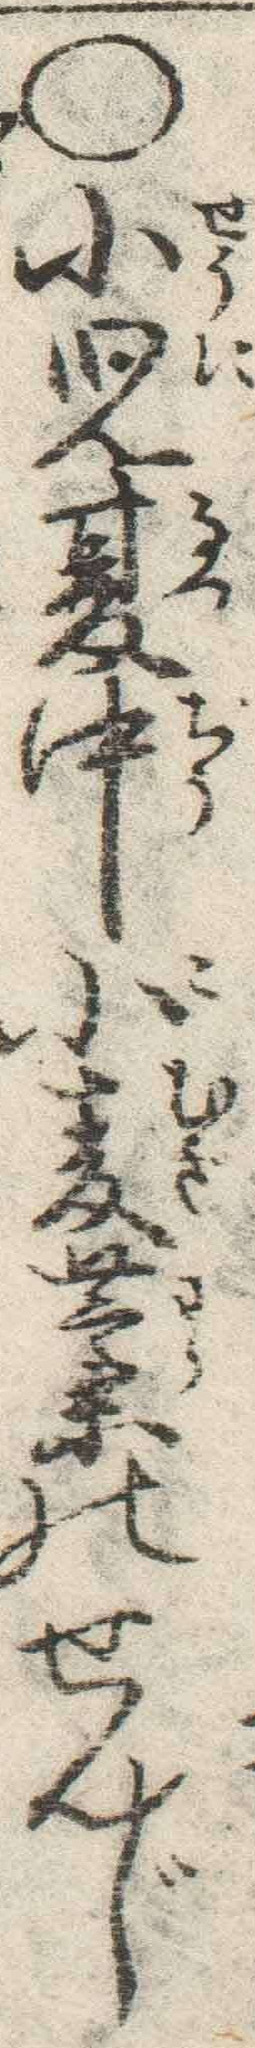○小児夏中小麦藁のせんじ
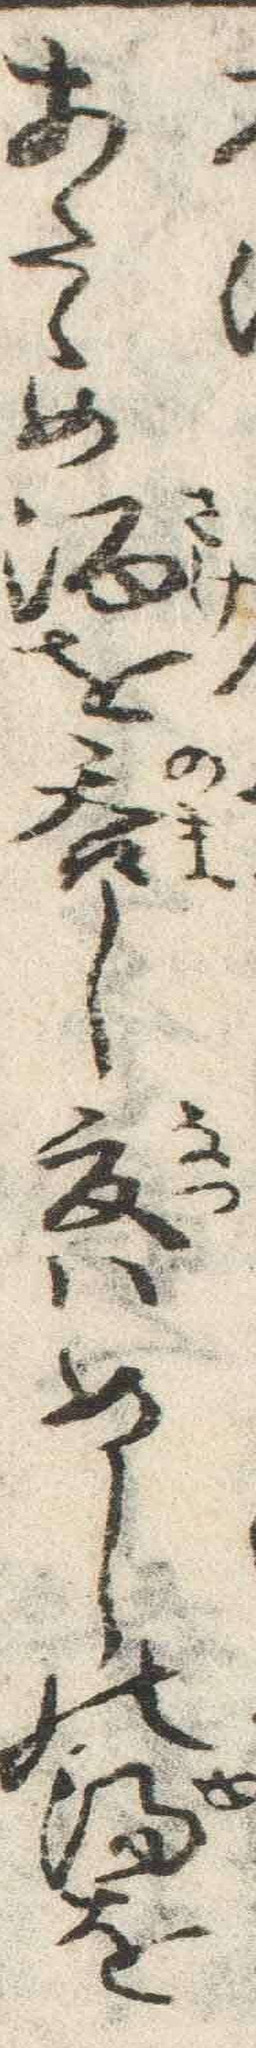あたゝめ酒を呑し夏はめしの湯を
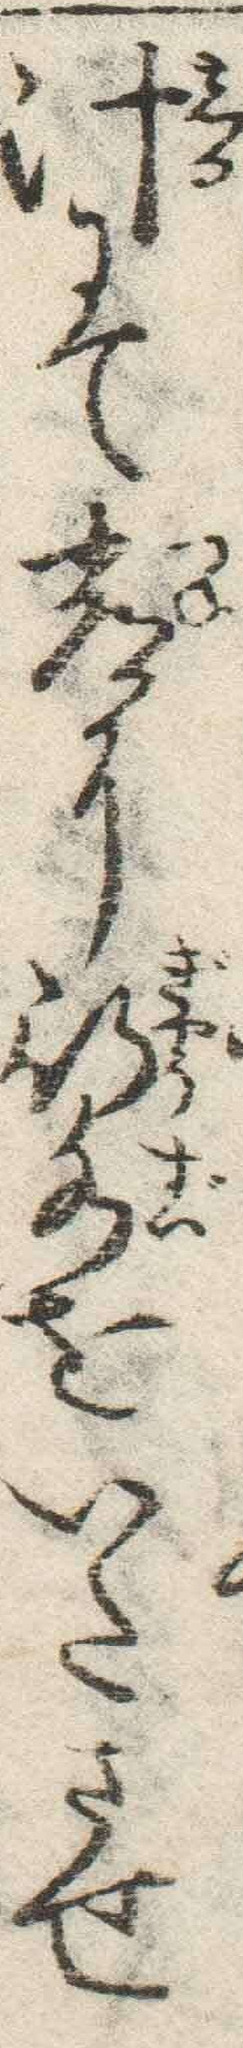汁にて常に行水をいたさせ
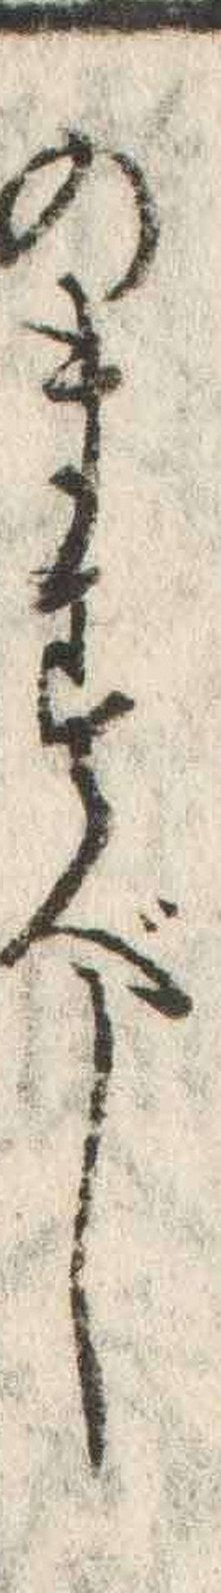のますべし
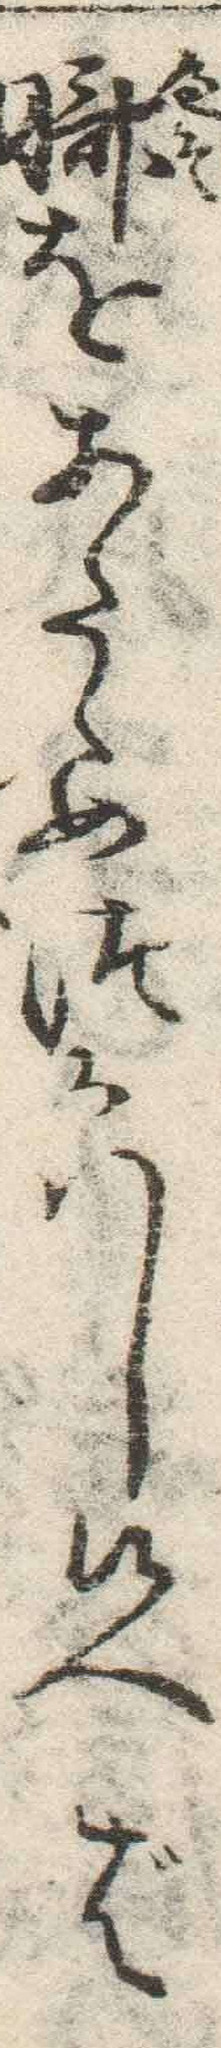臍をあたゝめつかはし候へば
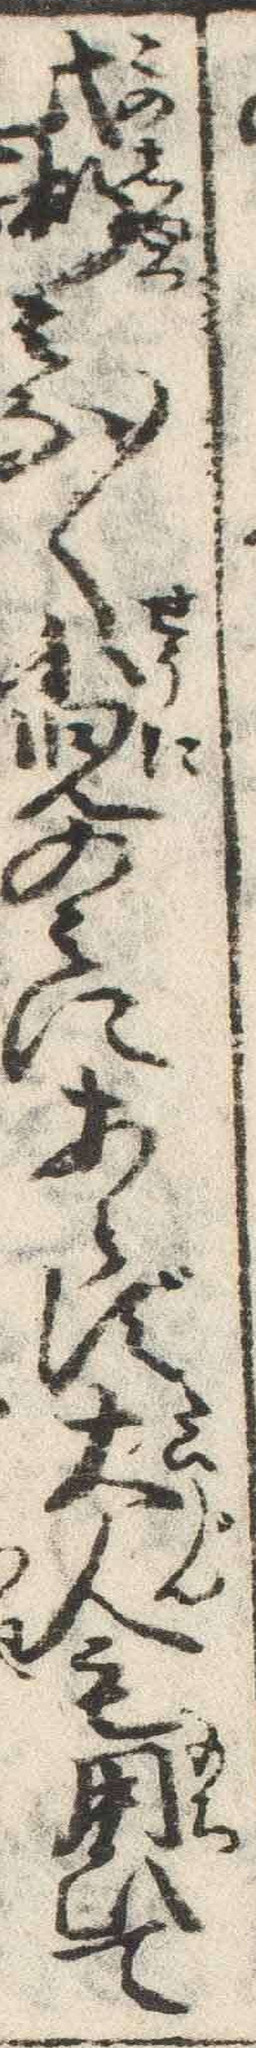此術みな〳〵小児のみにあらず大人も用ひて
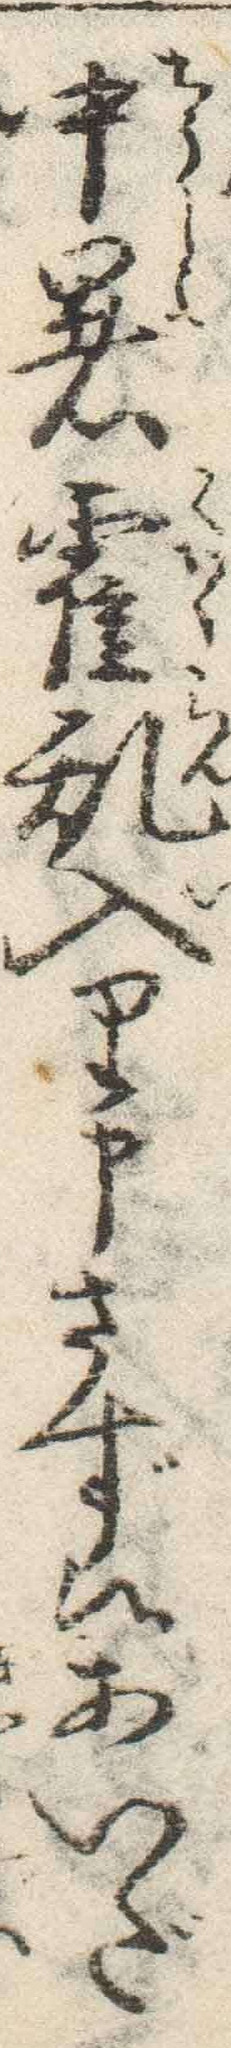中暑霍乱入り申さず候あいだ
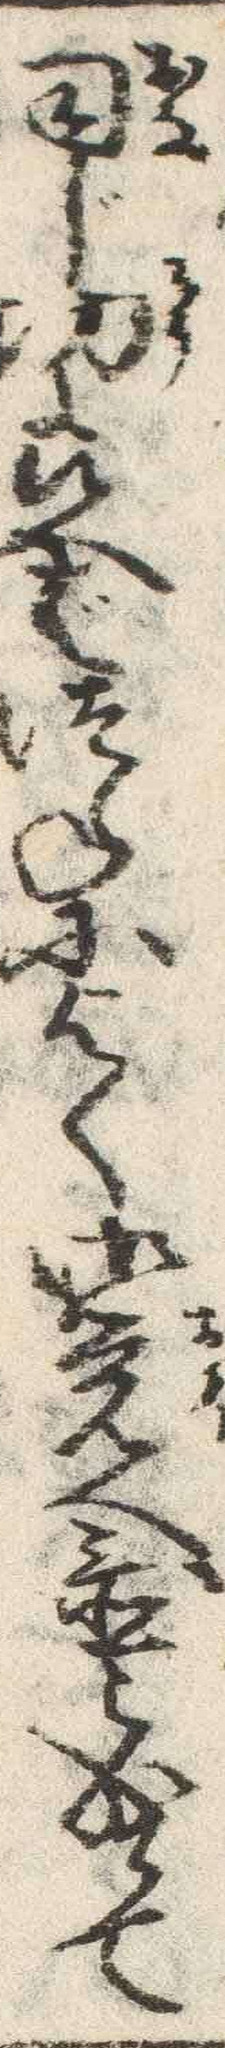同じ功に候へばつねによく御覚へ置被成候て
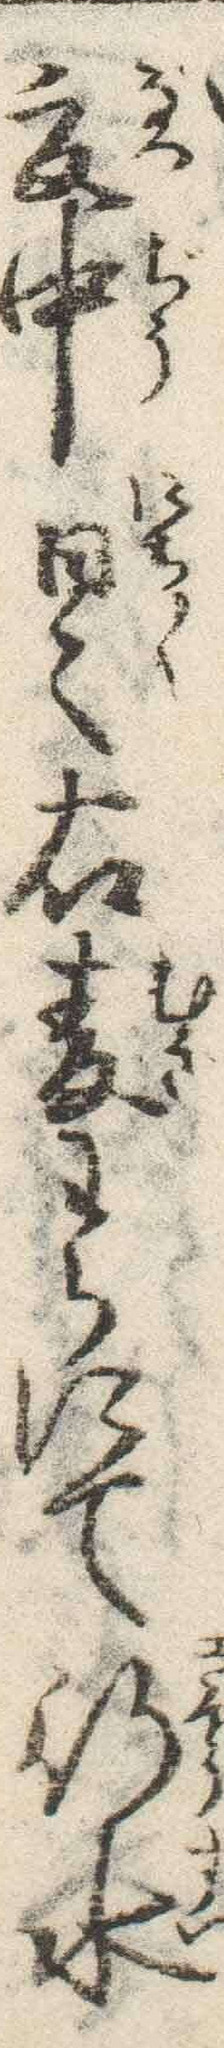夏中日々右麦わらにて行水
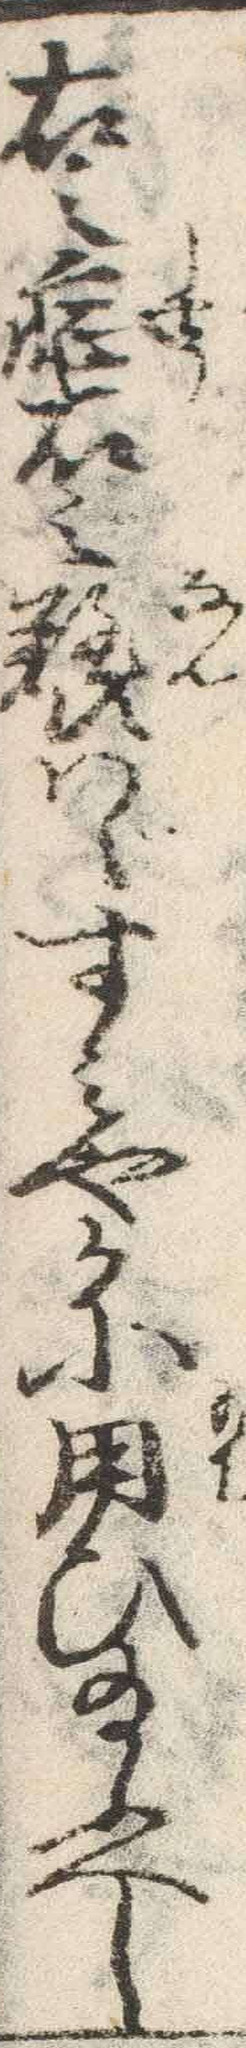右の症右の難候はゞすみやかに用ひ給ふへし
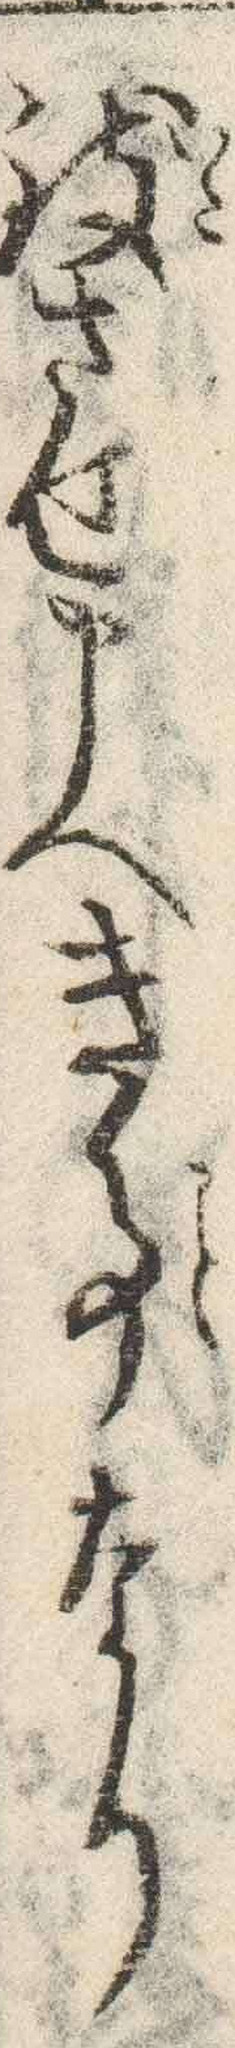致させ申へき事なり
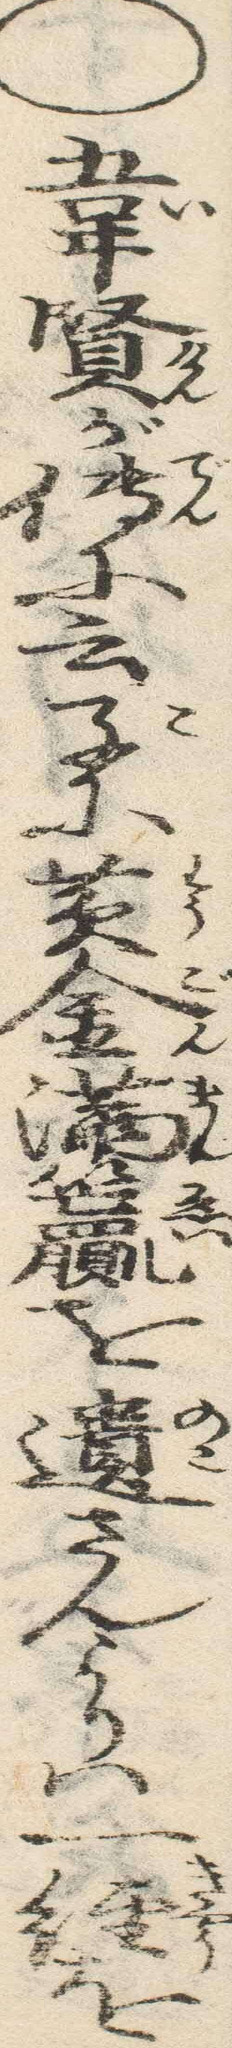○韋賢が伝に云子に黄金満籯を遺さんよりは一経を
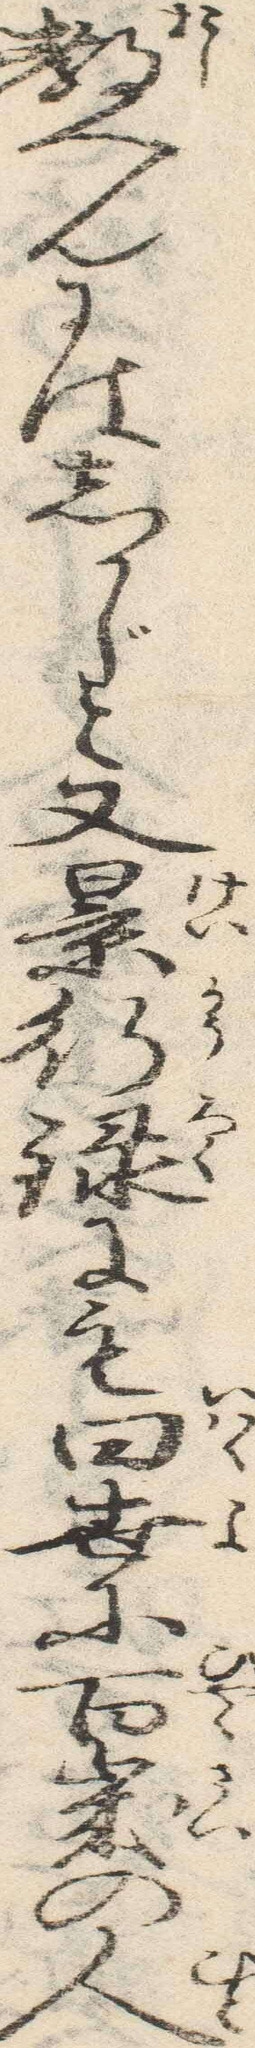教へんにはしかじと又景行録にも曰世に百歳の人
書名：撫育草
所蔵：東京学芸大学附属図書館 国文学研究資料館
